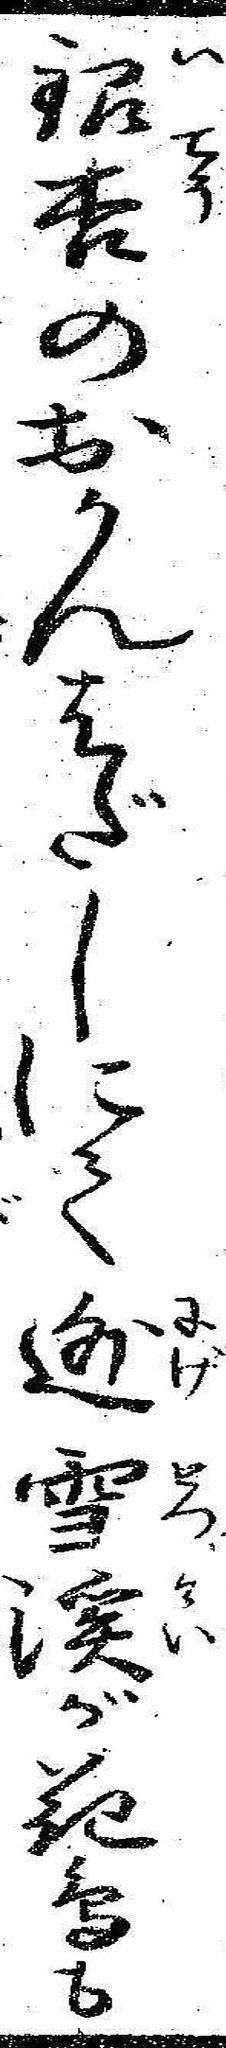銀杏のおかんはだしにて逃雪渓が花鳥も
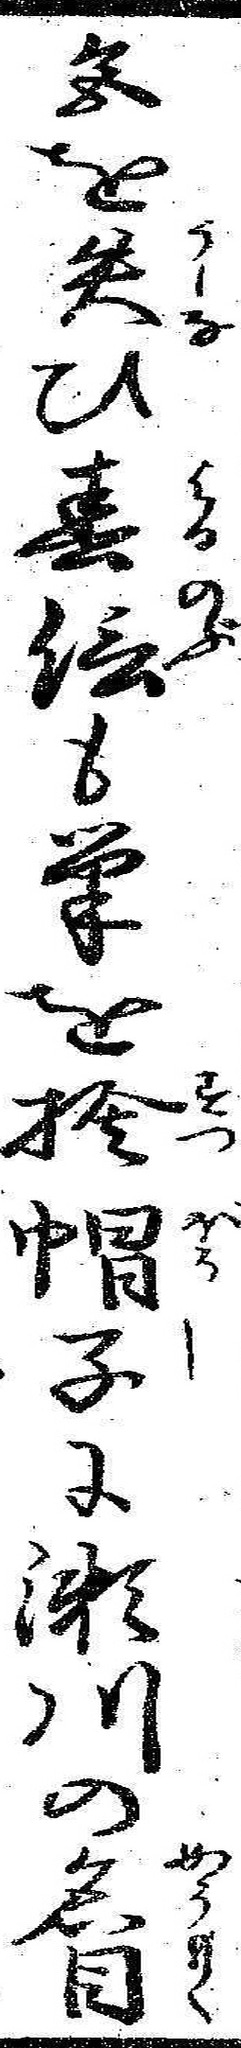色を失ひ春信も筆を捨帽子に瀬川の名目
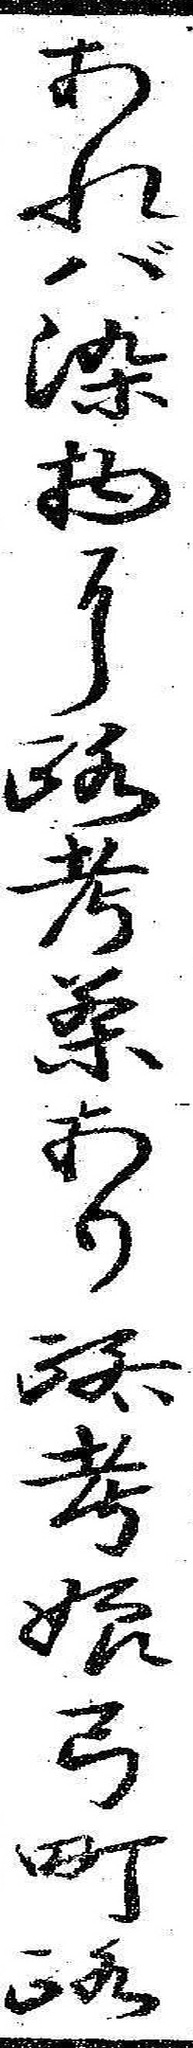あれば染物に路考茶あり路考娘弓町路
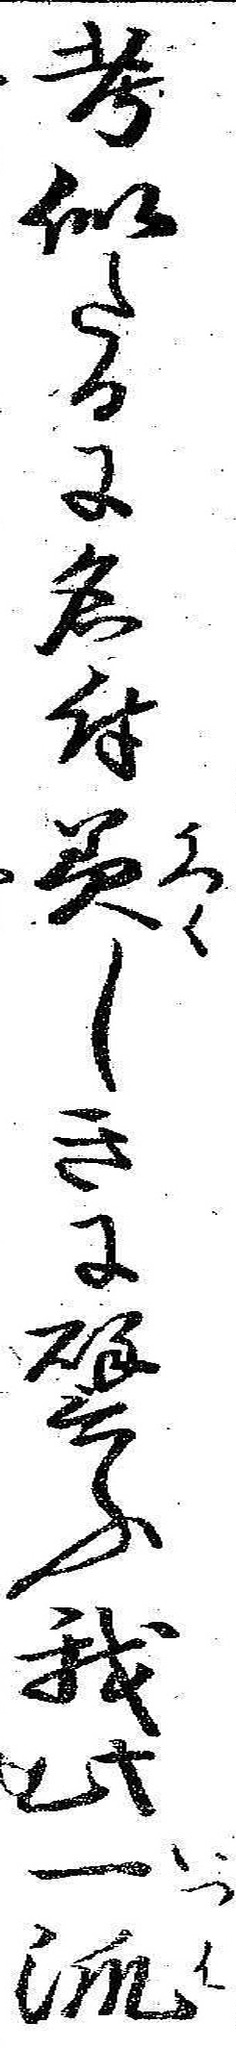考似たるに名付美しきに譬ふ我此一派
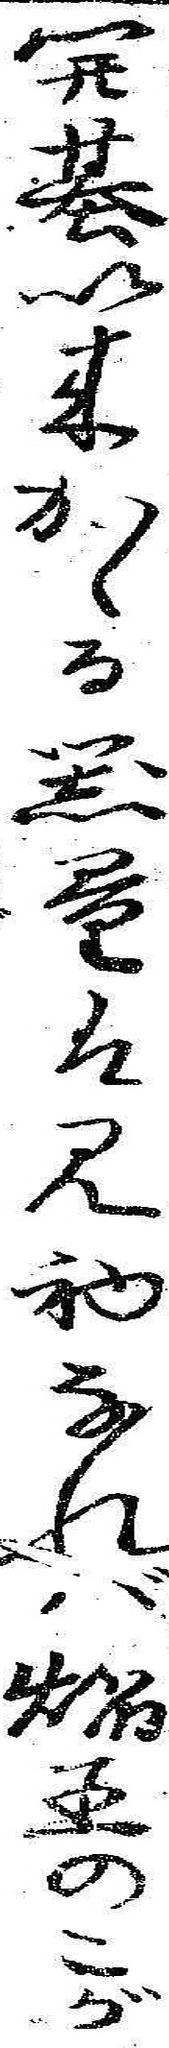開基以来かゝる器量は見初なれば焔王のこが
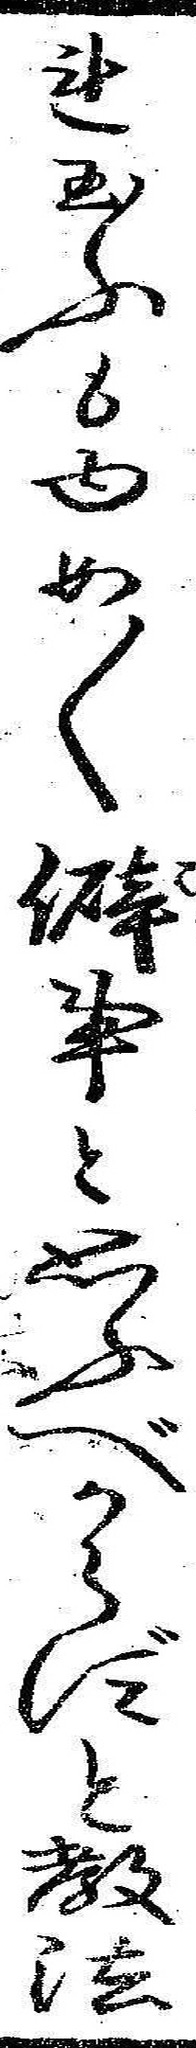れ玉ふもゆめ〱僻事と思ふべからずと教法
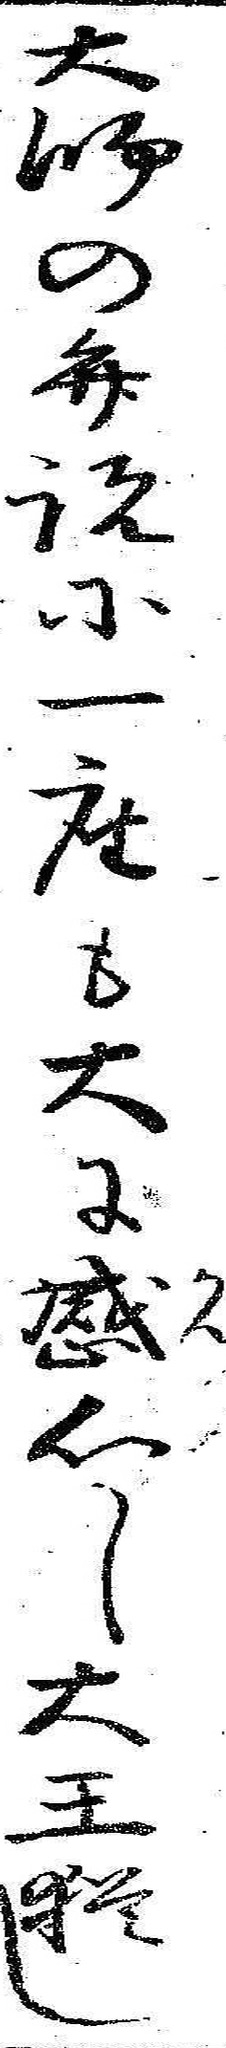大師の弁説に一座も大に感心し大王猶し
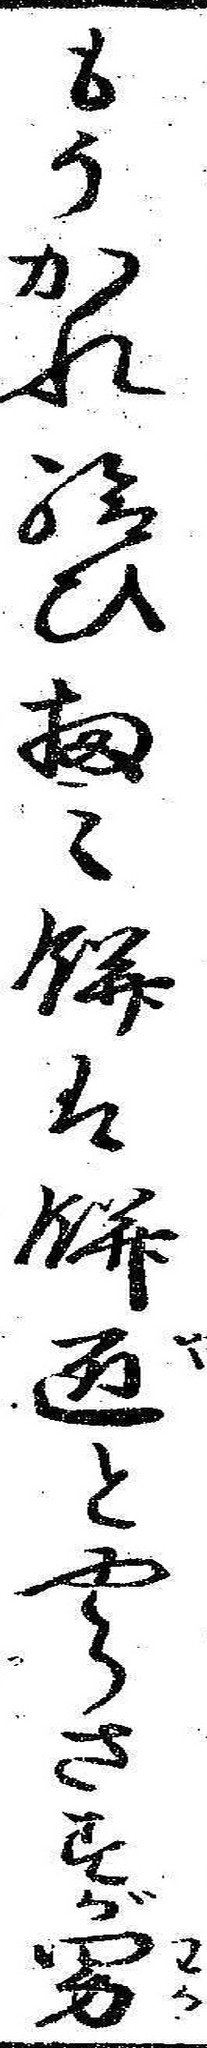もうかれ給ひ扨々餅は餅匠とやらさすが男
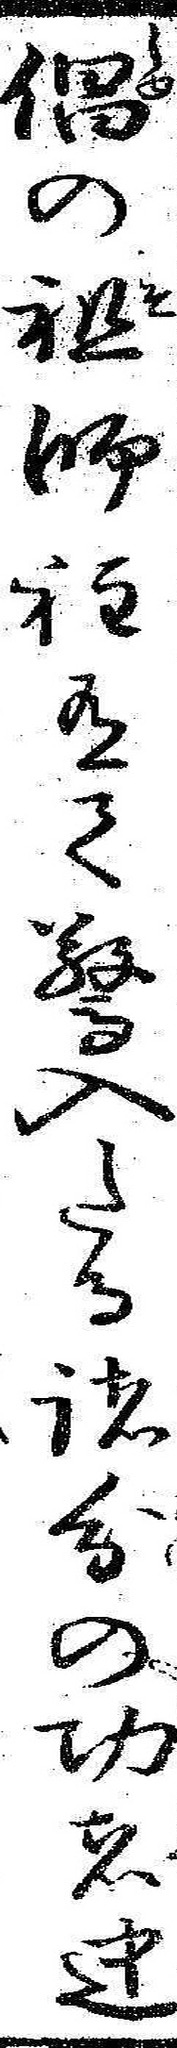倡の祖師程有て驚入たる諸分の功者迚
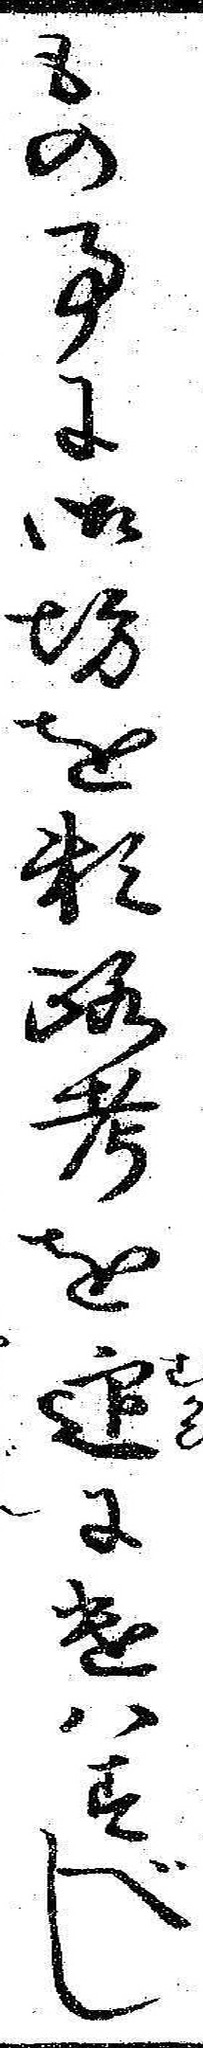もの事に御坊を頼路考を迎に遣はすべし
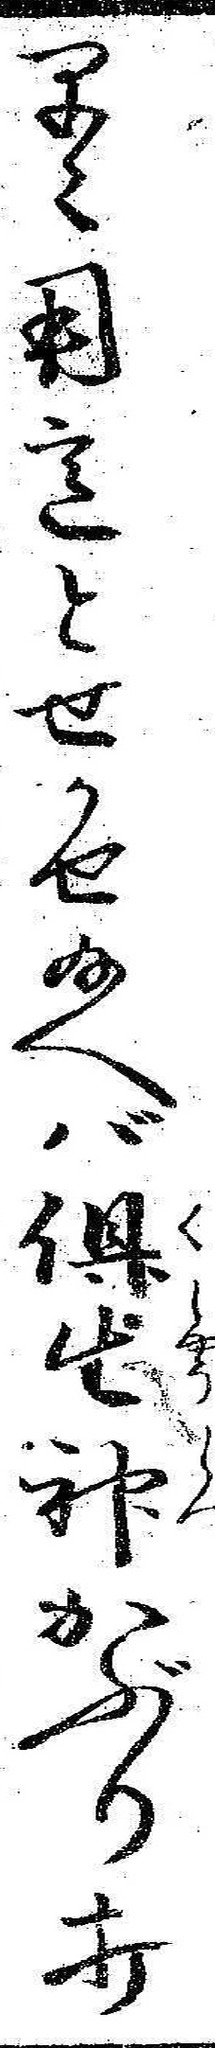早々用意とせかせ給へば倶生神かぶり打
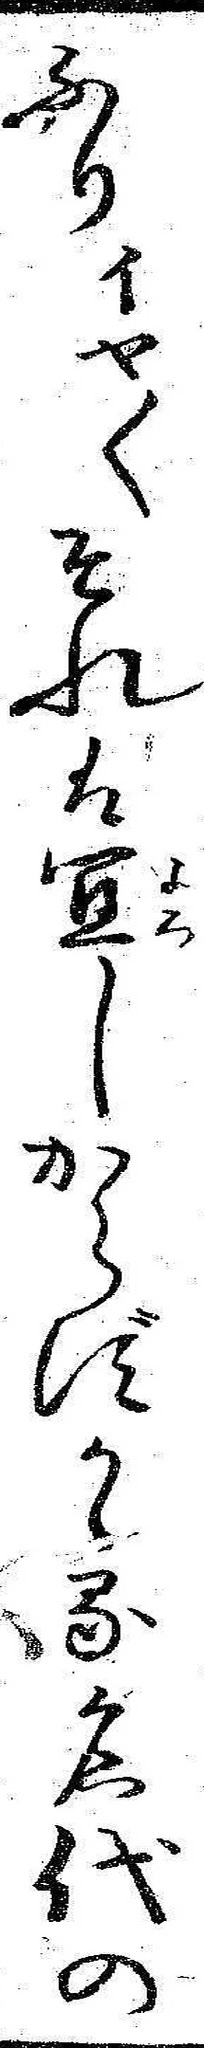ふり〳〵それは宜しからずかゝる名代の
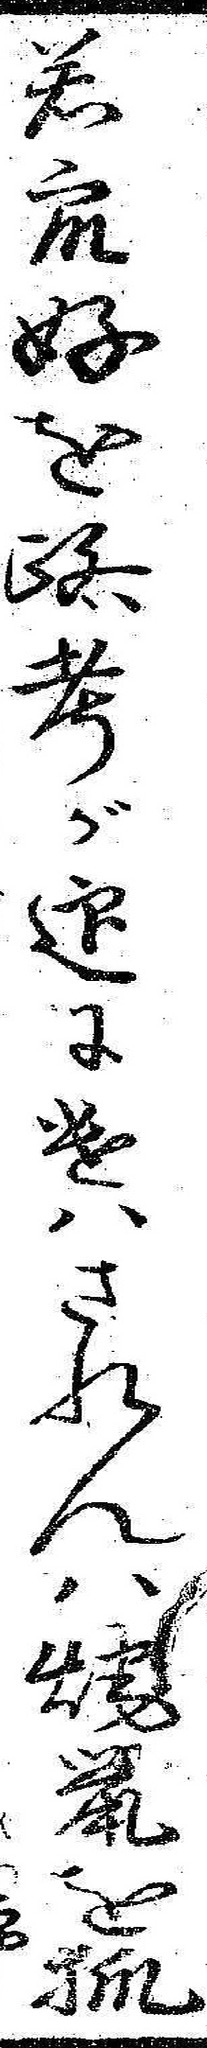若衆好を路考が迎に遣はされんは焼鼠を狐
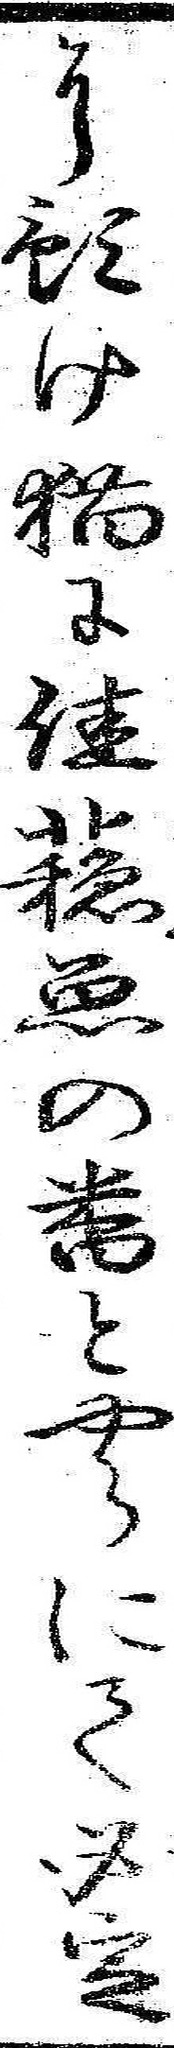に預け猫に佳蘇魚の番とやらにて必定
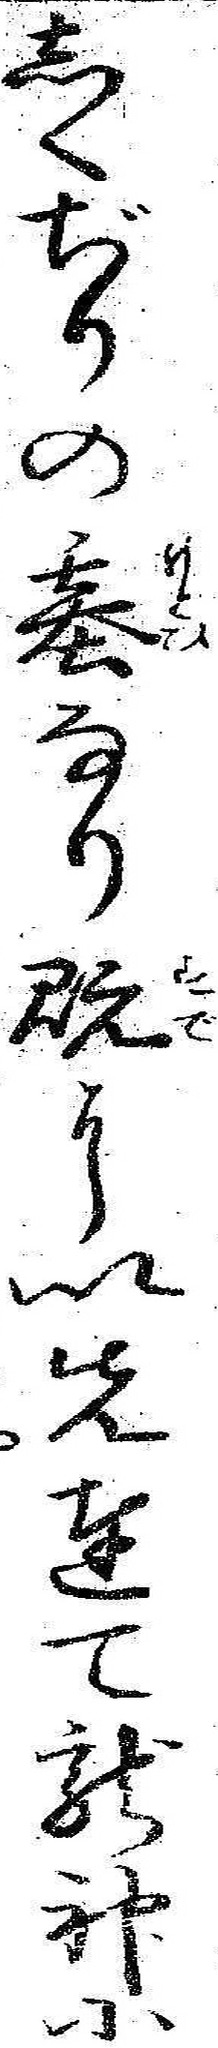しくぢりの基なり既に以先達て竜神に
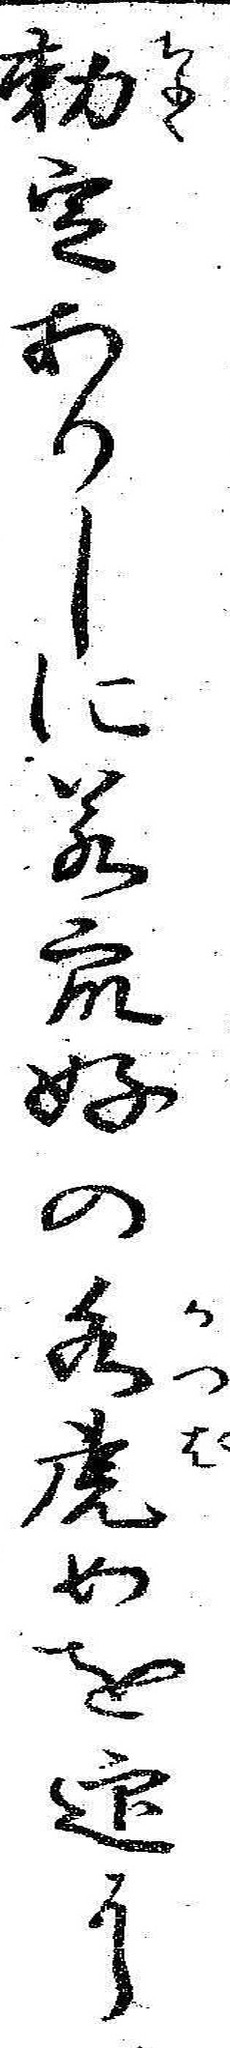勅定ありしに若衆好の水虎めを迎に
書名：根無草後編
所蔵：国文学研究資料館
